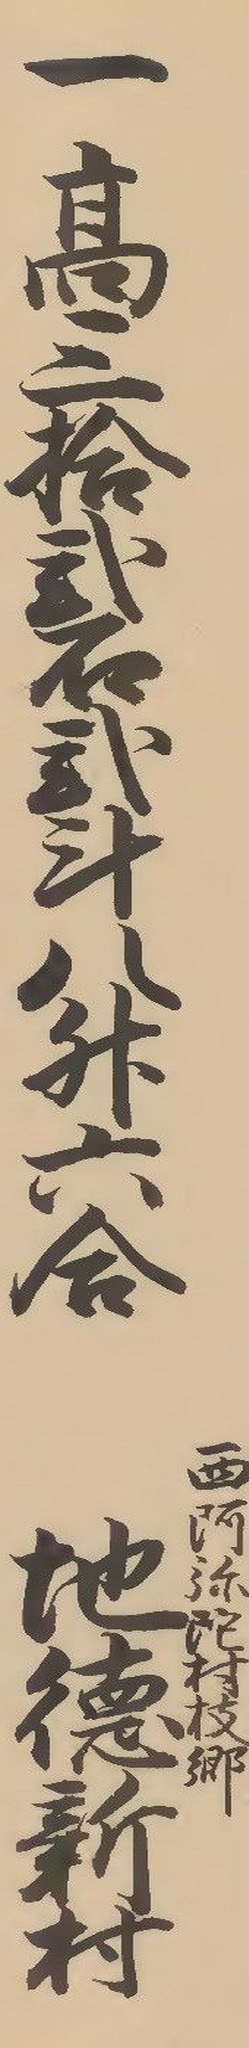一髙三拾弐石弐斗八升六合地徳新村
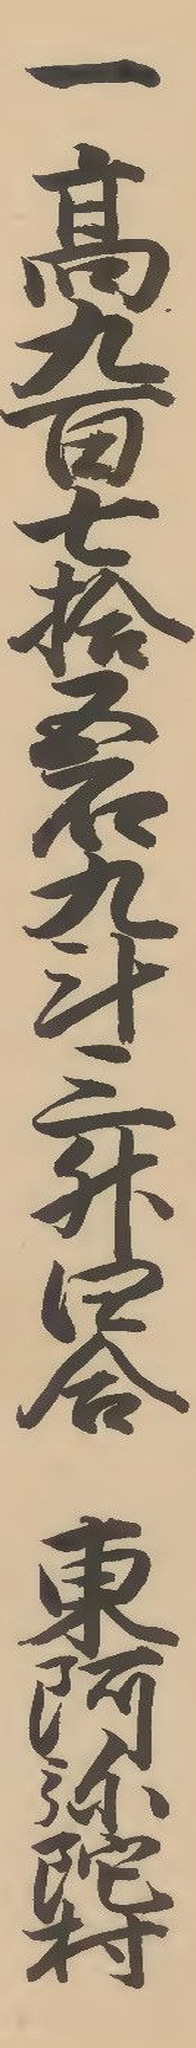一髙九百七拾五石九斗三升四合東阿弥陀村
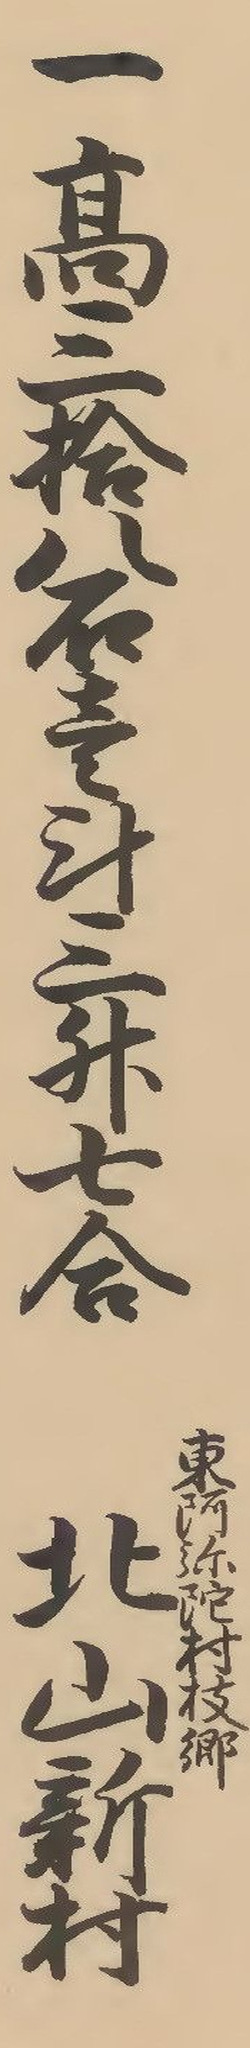一髙三拾八石壱斗三升七合北山新村

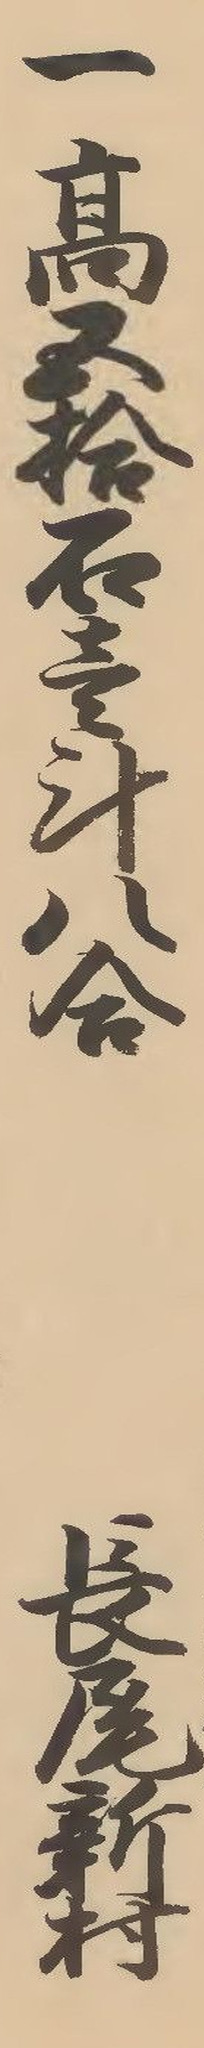一髙五拾石壱斗八合長尾新村
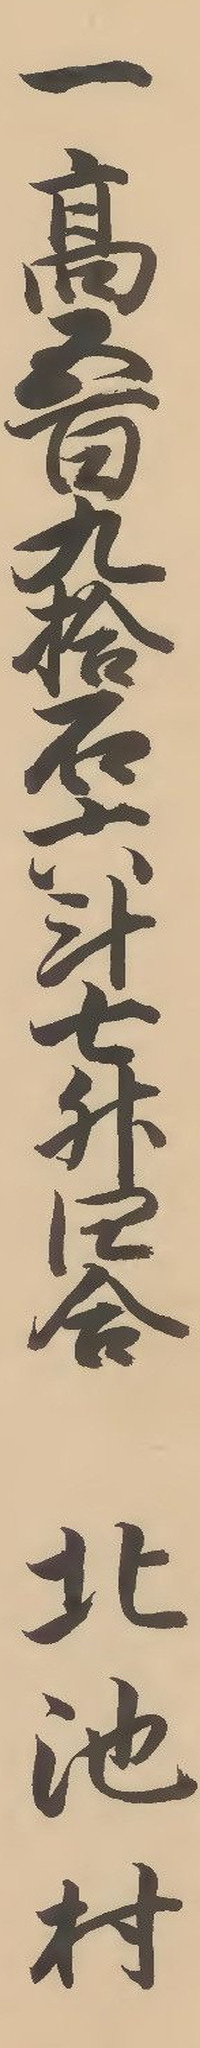一髙五百九拾石六斗七升四合北池村
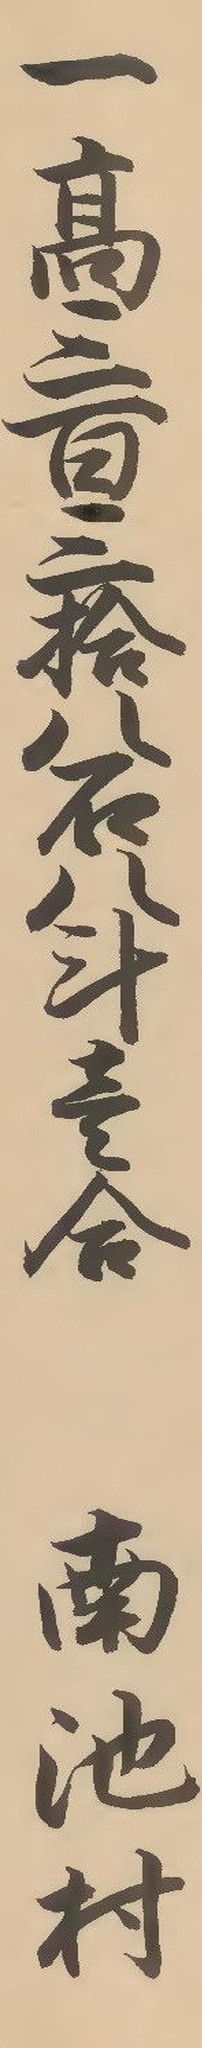一髙三百三拾八石八斗壱合南池村
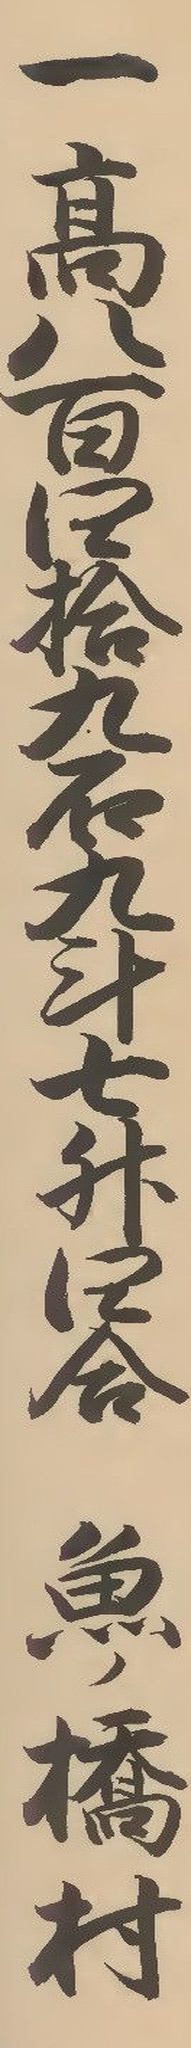一髙八百四拾九石九斗七升四合魚ノ橋村
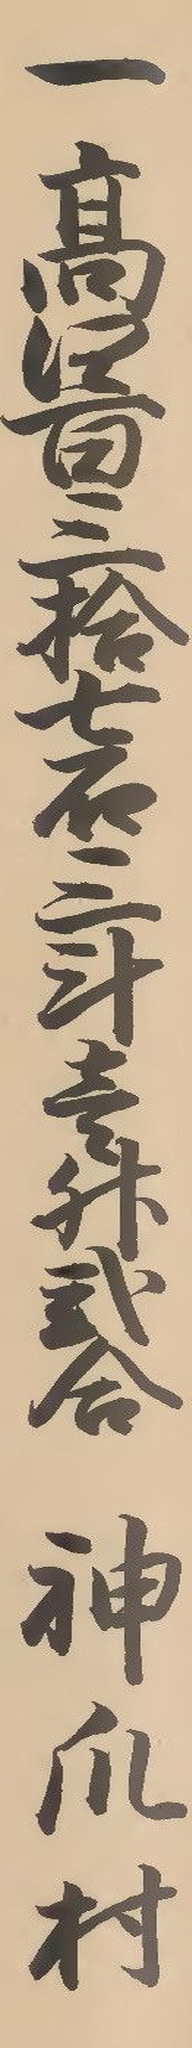一髙四百三拾七石三斗壱升弐合神爪村
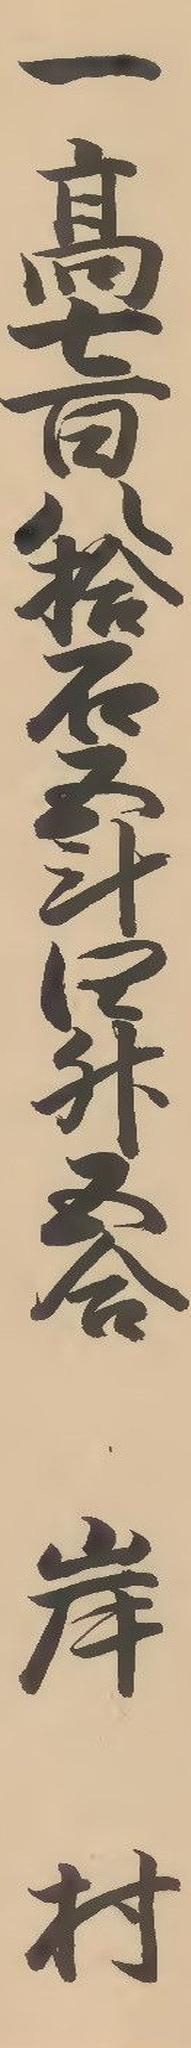一髙七百八拾石五斗四升五合岸村
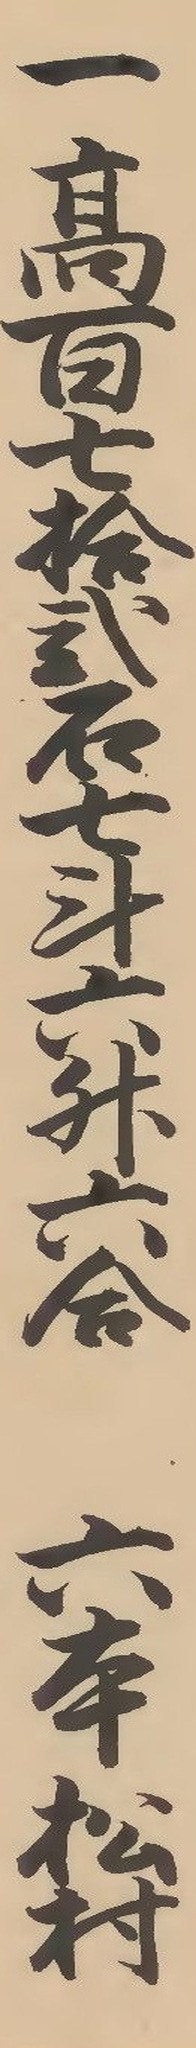一髙百七拾弐石七斗六升六合六本松村
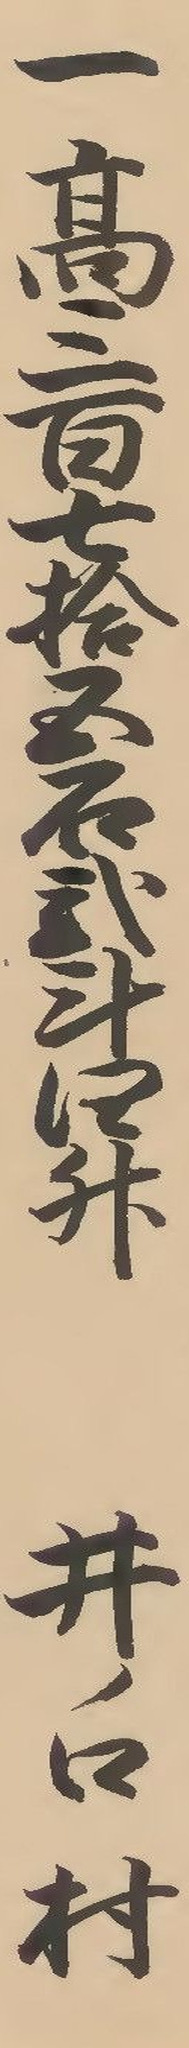一髙三百七拾五石弐斗四升井ノ口村

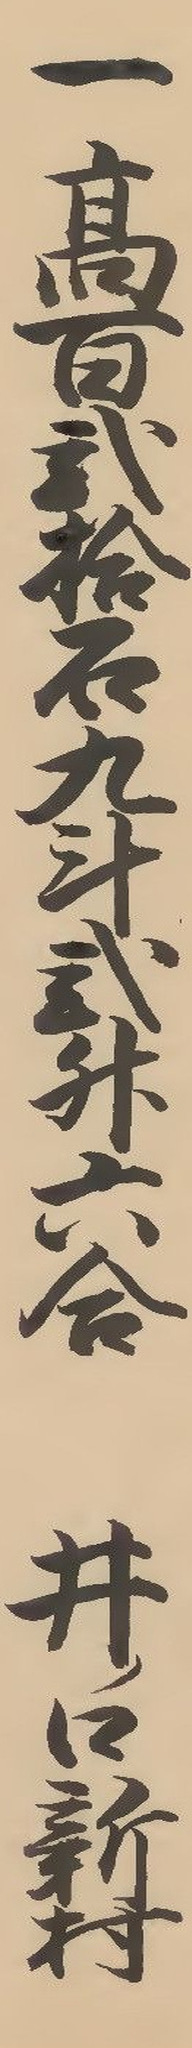一髙百弐拾石九斗弐升六合井ノ口新村
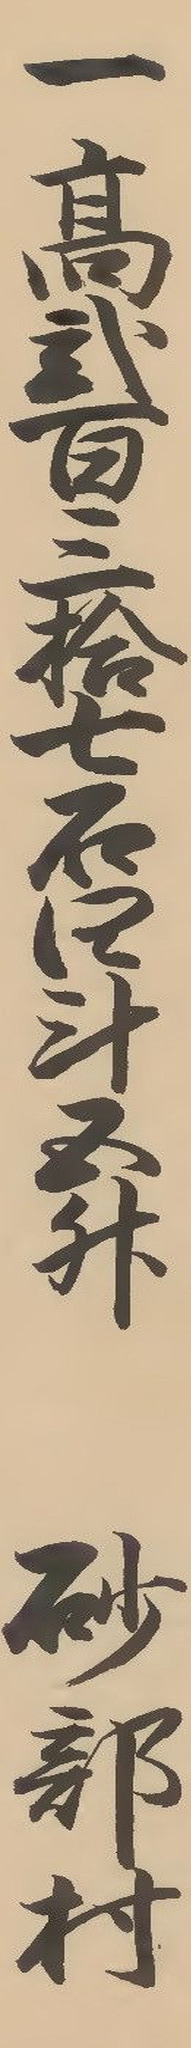一髙弐百三拾七石四斗五升砂部村
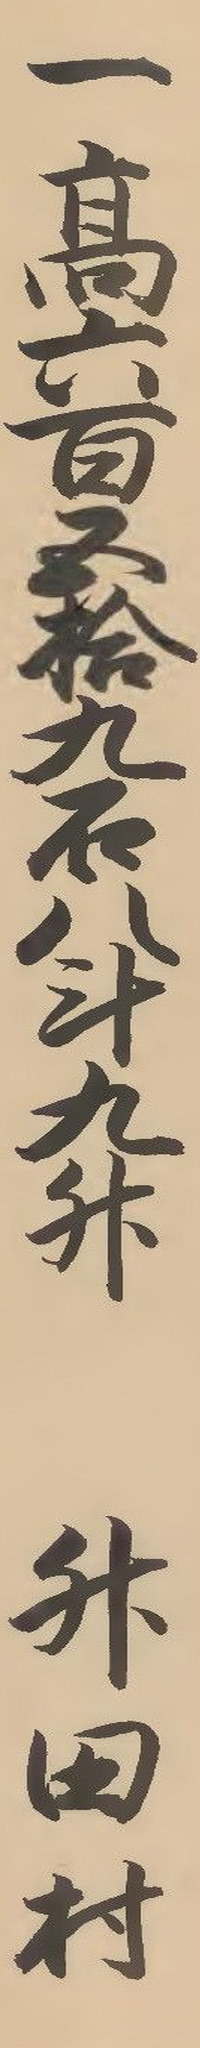一髙六百五拾九石八斗九升舛田村
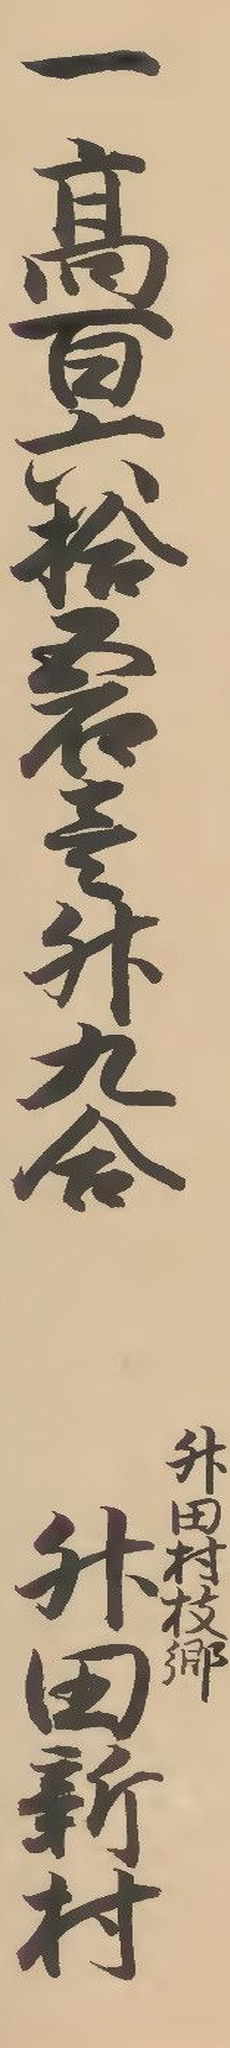一髙百六拾五石壱升九合舛田新村
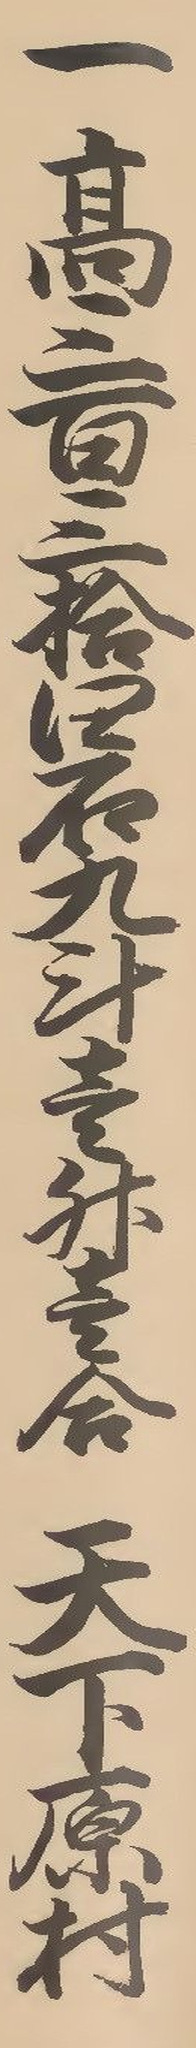一髙三百三拾四石九斗壱升壱合天下原村
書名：播磨国郷帳
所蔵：国立公文書館 National Archives of Japan
